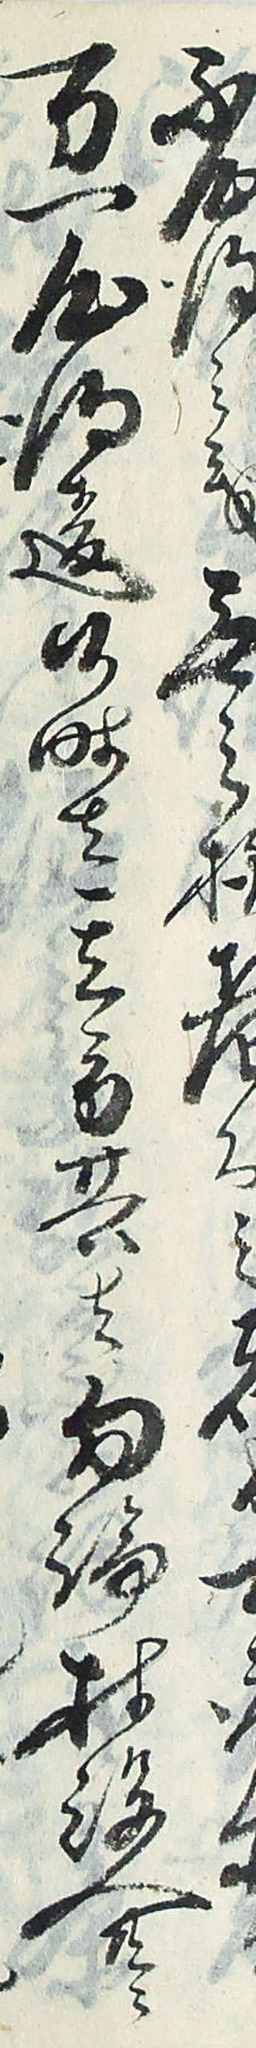万一心得違候時は其方共は勿論村役人共に
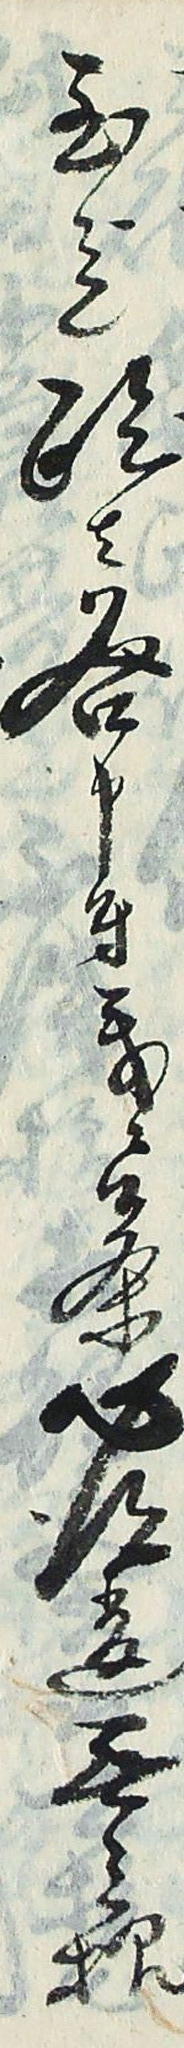至迄屹と咎申付義に候条心得違無之様
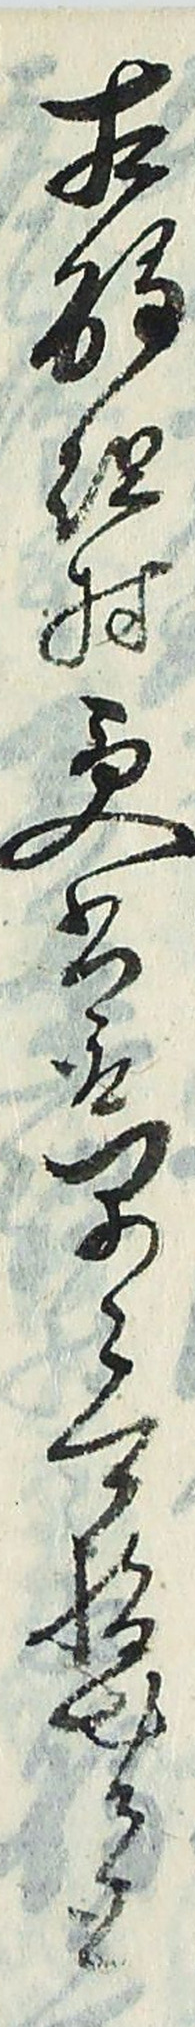相触組村受書取早々可指出候以上
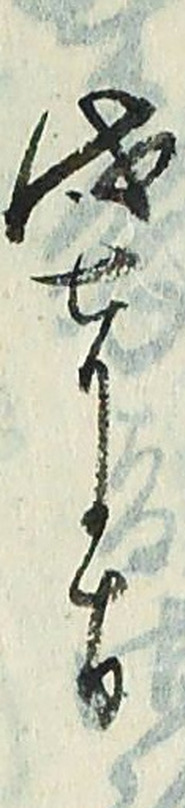戌七月別帋
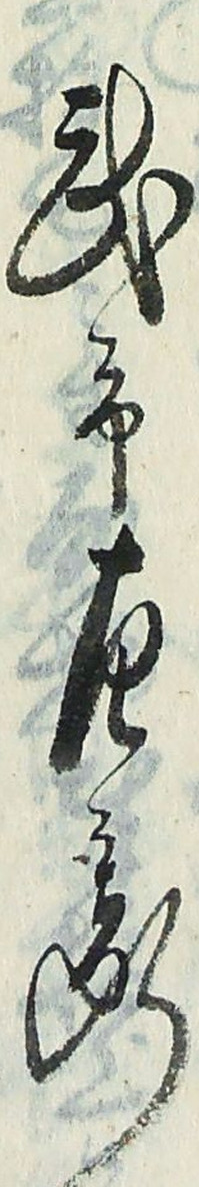武市左兵衛
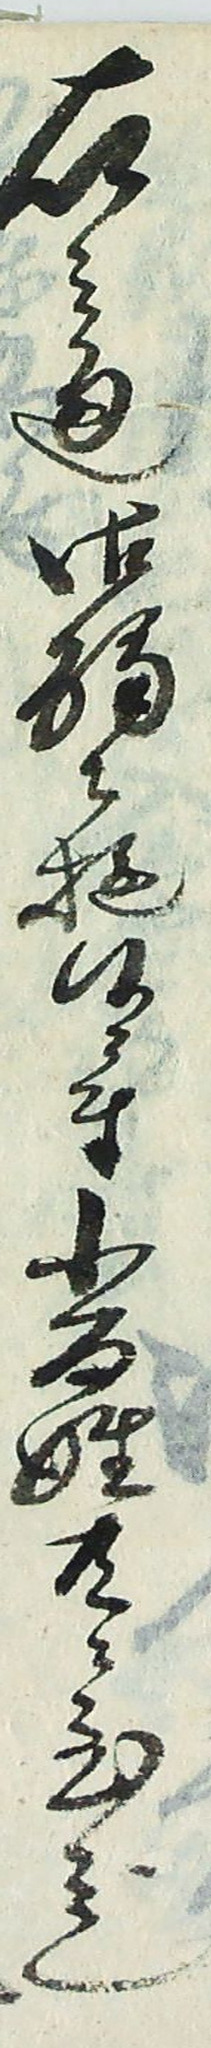右之通御触被遊候に付小百姓共に至迄
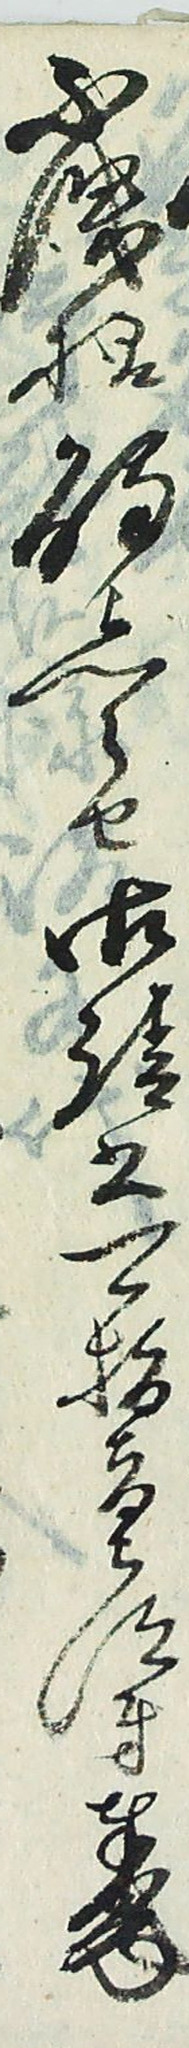不洩様触しらせ御請書可指旨被仰付奉畏
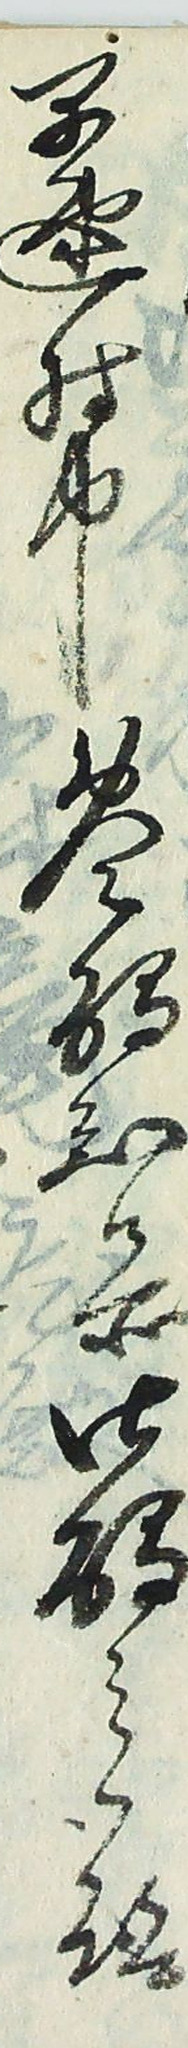早速村中尽触知候所御触之御趣
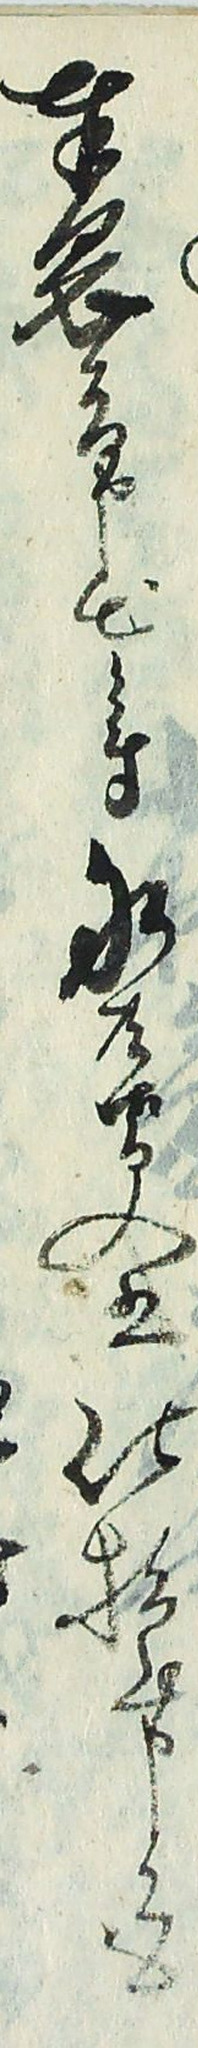奉畏旨申出候に付私共受書仕指上申候以上
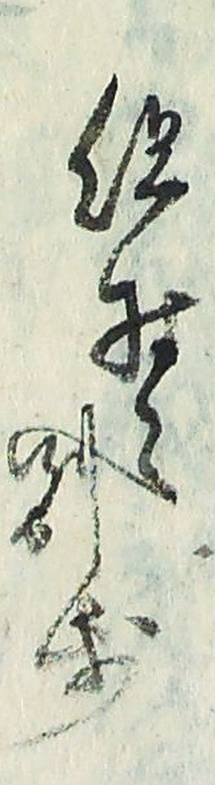組村々
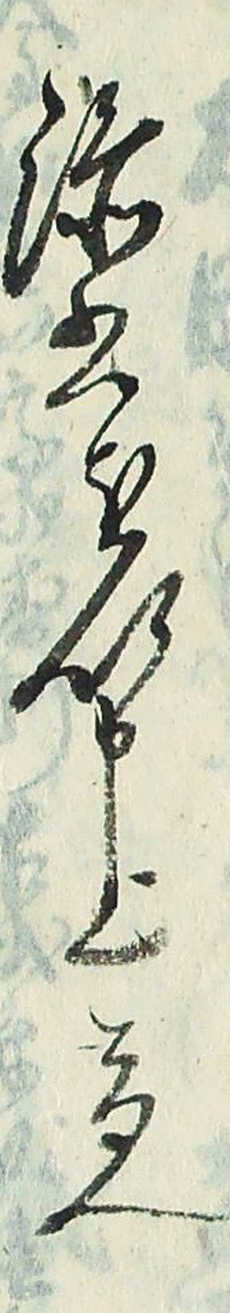添書を以申上覚
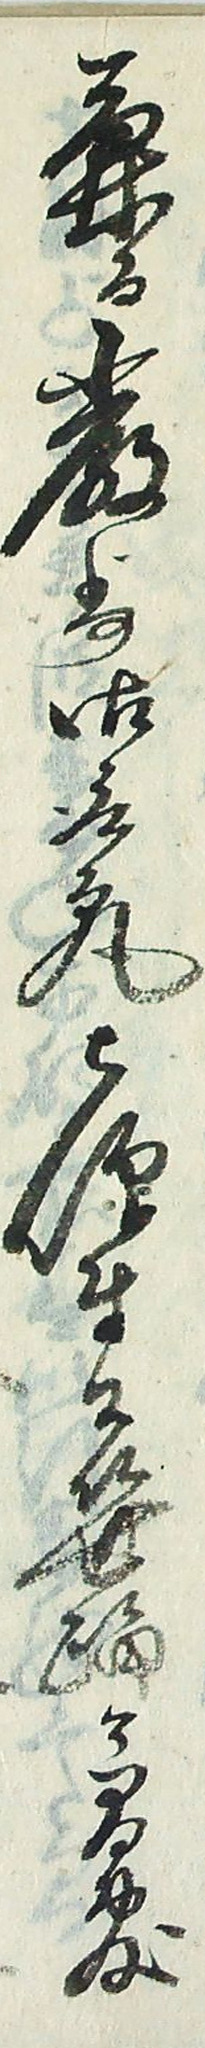兼而厳布御取究被仰付候笹踊ケ間敷
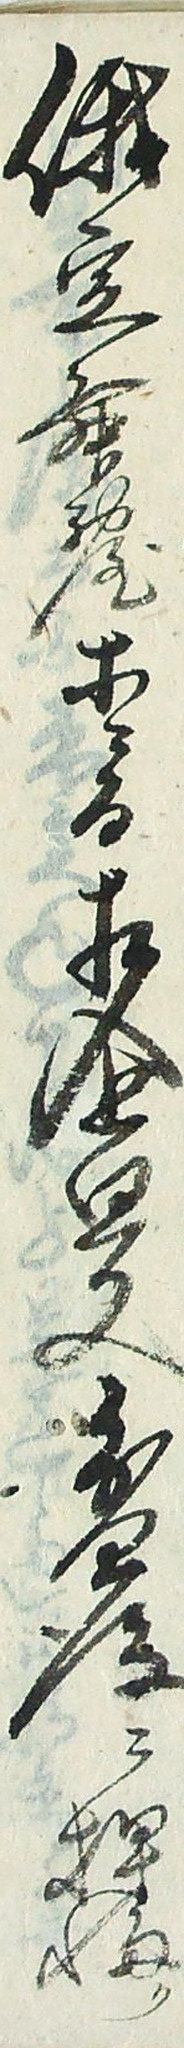俄定舞台等に而相企且又盆後に押移り

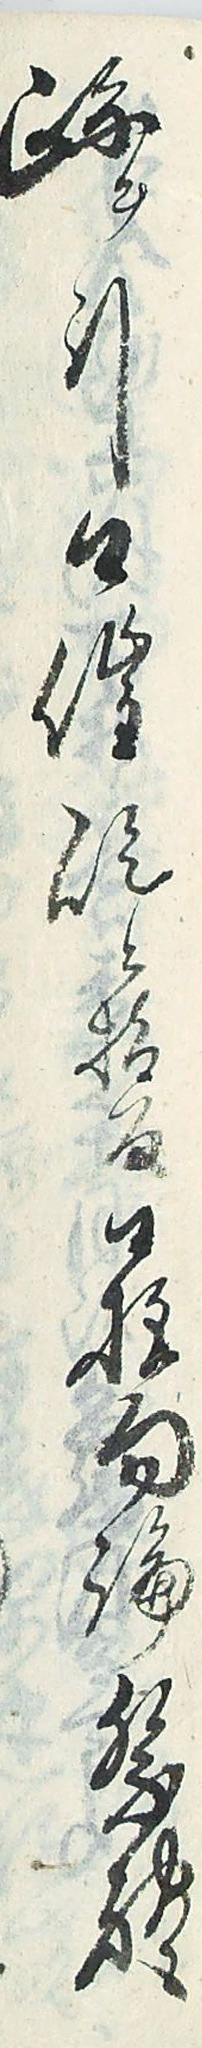跡を引候催屹と指留候様勿論祭礼
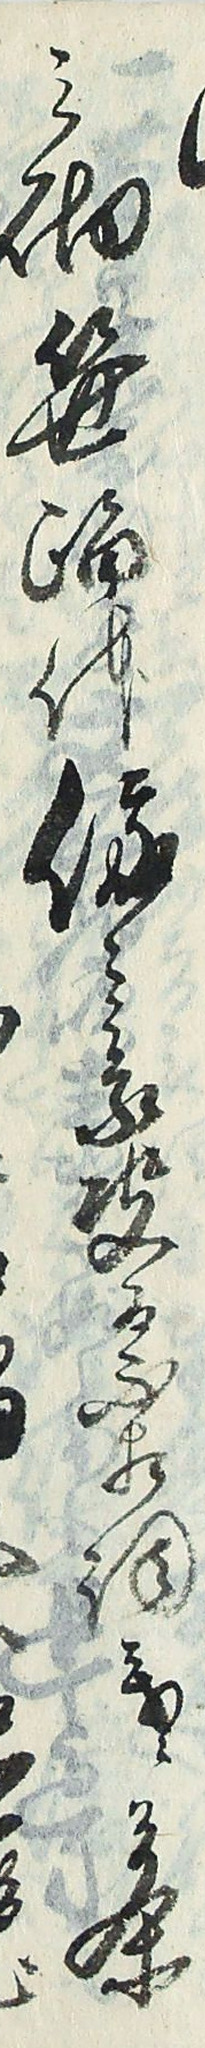之砌笹踊体俄之義決而不相調義に候条
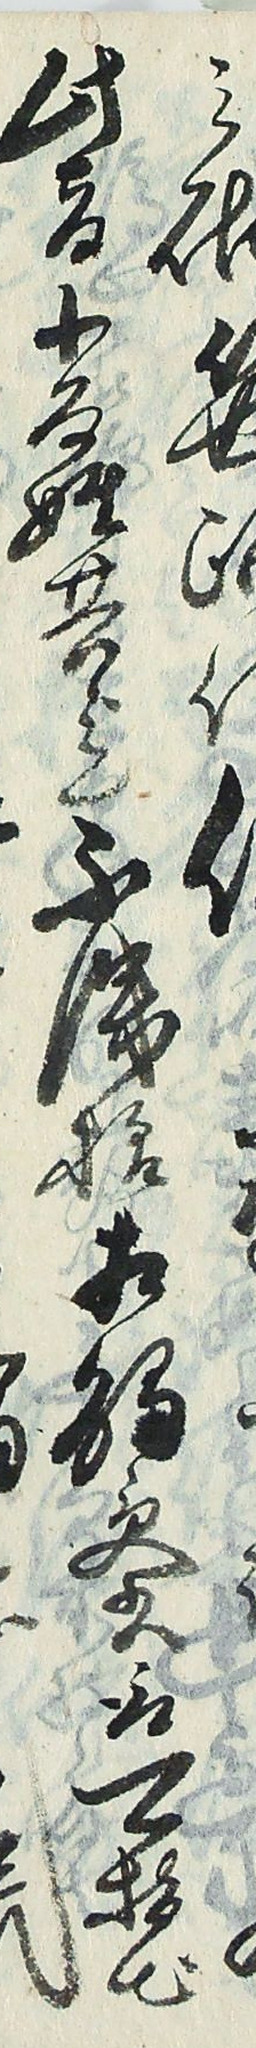此旨小百姓共迄不洩様相触御受書取可指出
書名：諸御用御□受書控
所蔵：鳴門教育大学 Naruto University of Education
